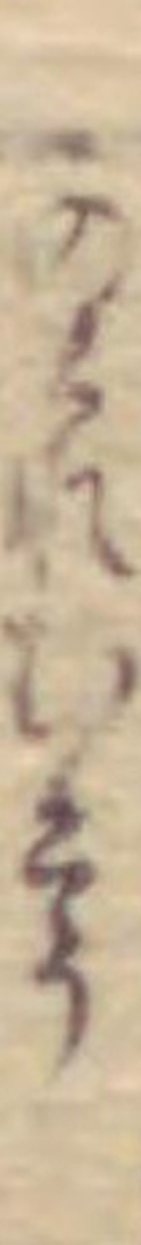のくれむこう
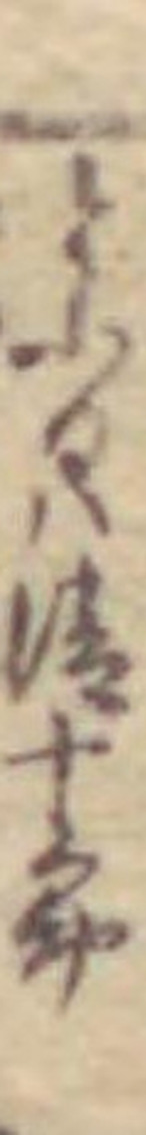とふるは清十か郎
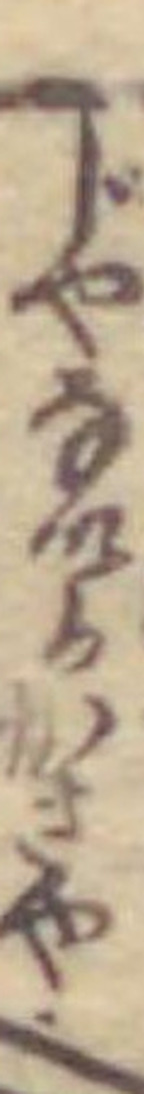じやないかかさや
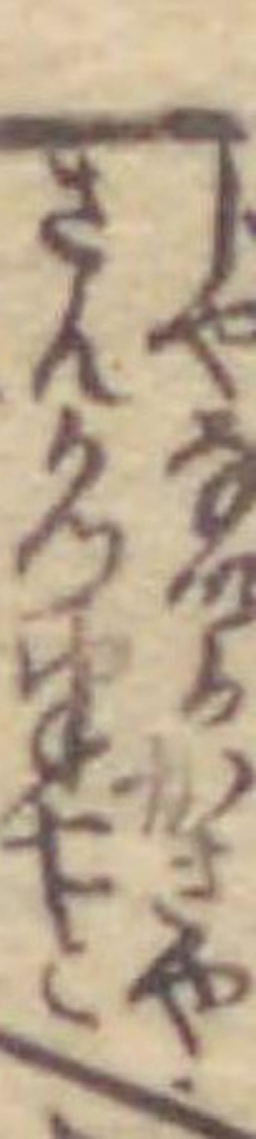さんかつ半七と
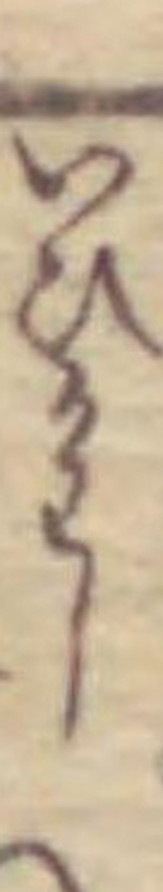いひかわし
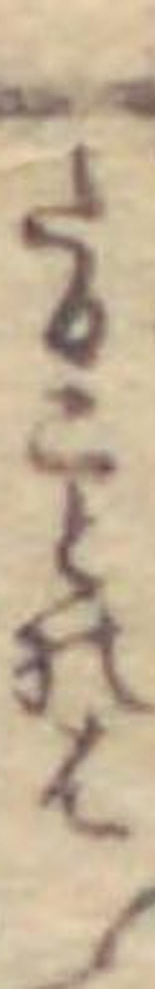たることのは
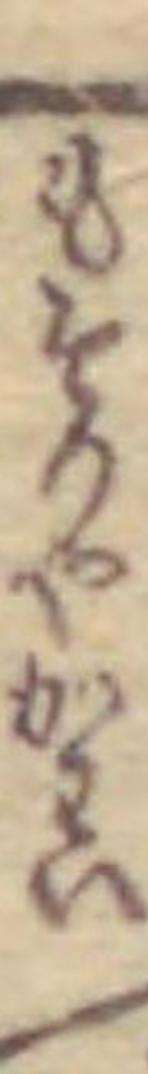もそりやかわい
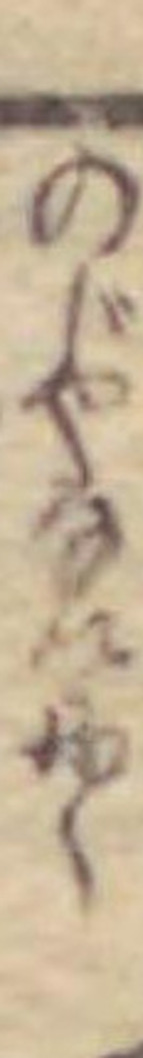のじやないにく
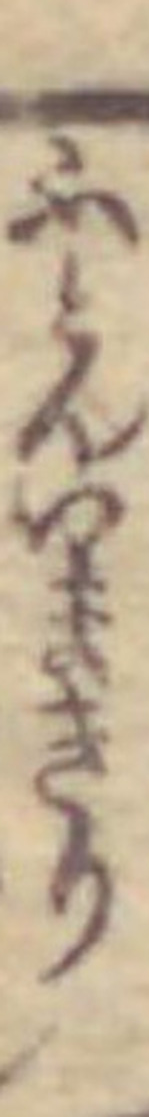ふとんいまきり
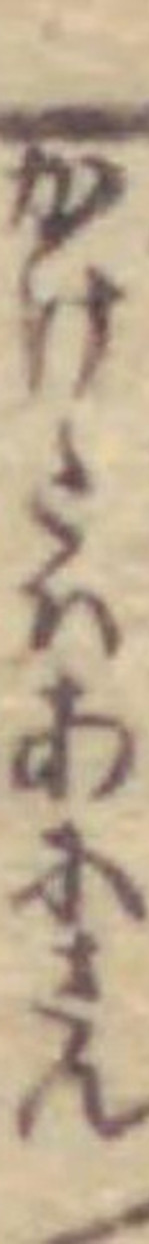かけたはあにさん
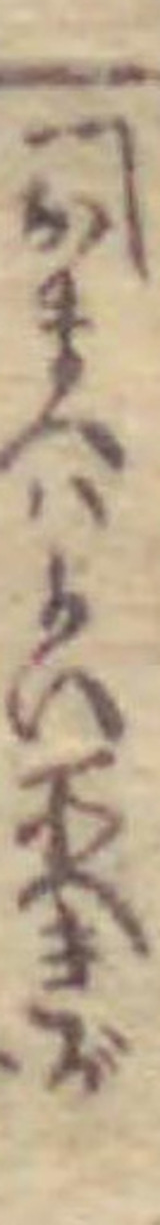〽おまへはよい所へきが
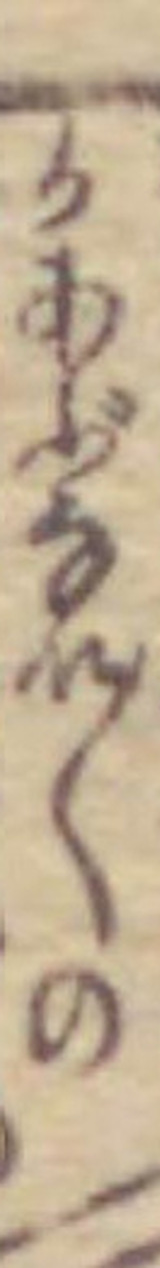かあぶない〳〵の
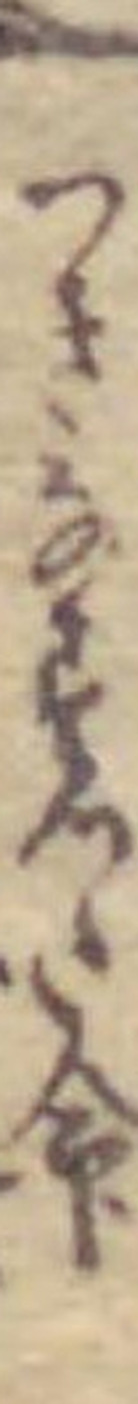つきなすつた命
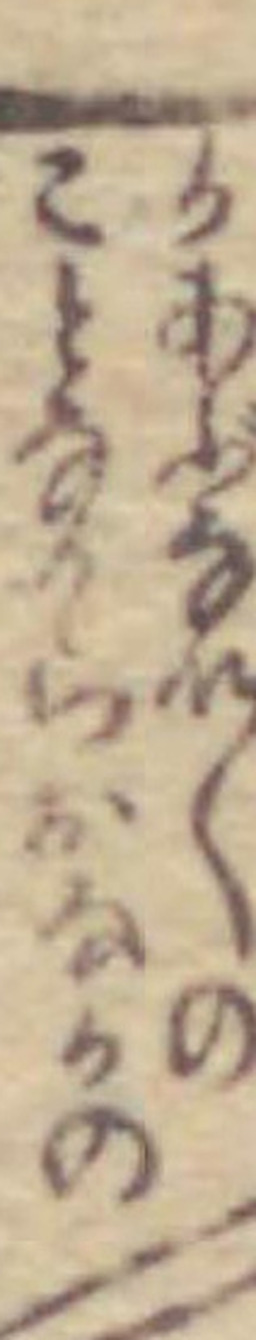ことなからおなかの
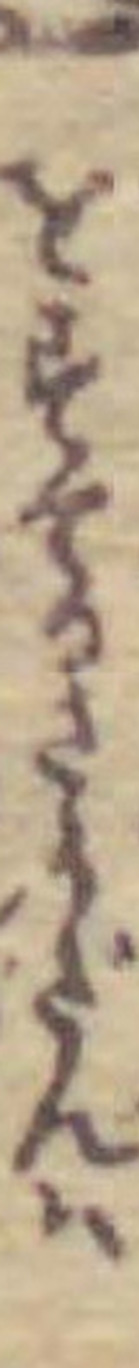をすてるさうだんは
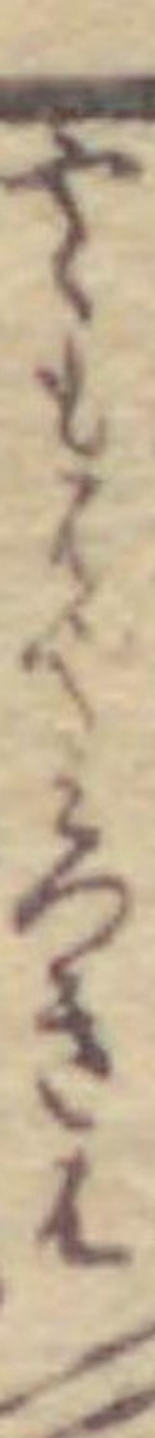やゝもはやみつきは
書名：御誂染長寿小紋 : 3巻
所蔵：国立国会図書館 National Diet Library, JAPAN
